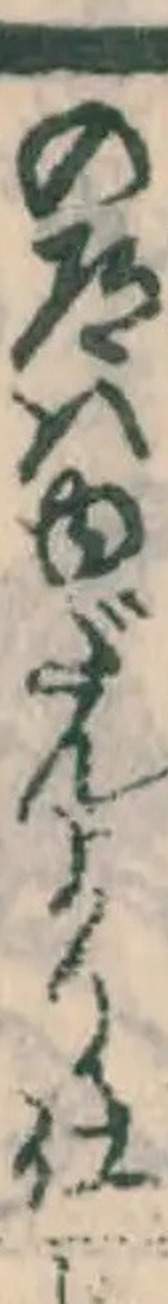の道はゆだんより仕
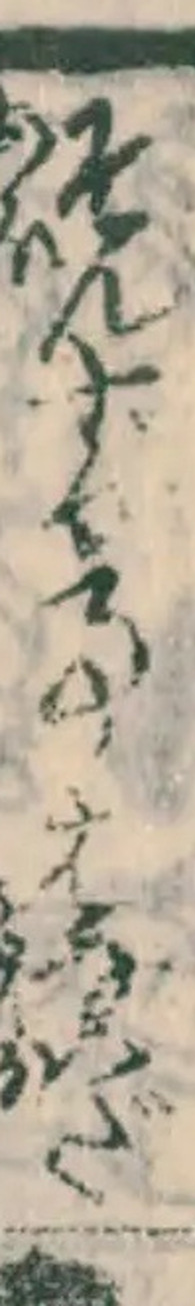そんする事はなはだ
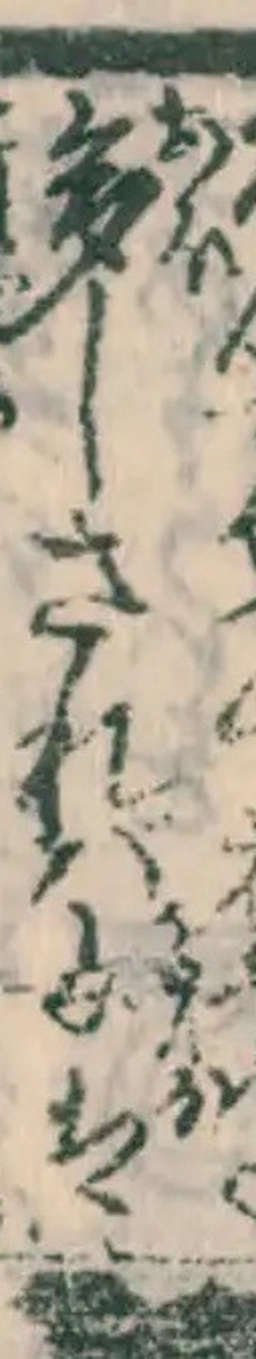多しされば女は
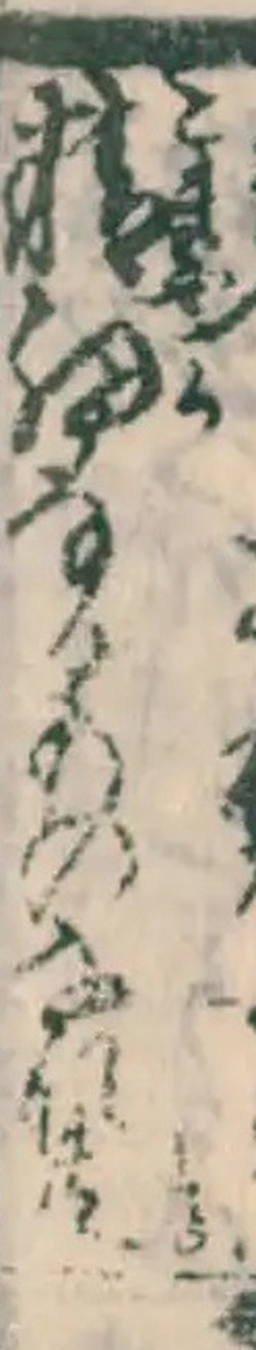精細なるものなれ共
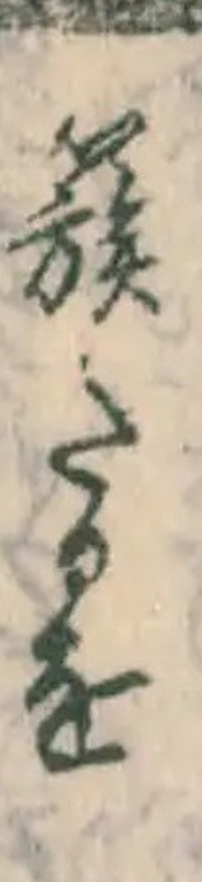簇たるを
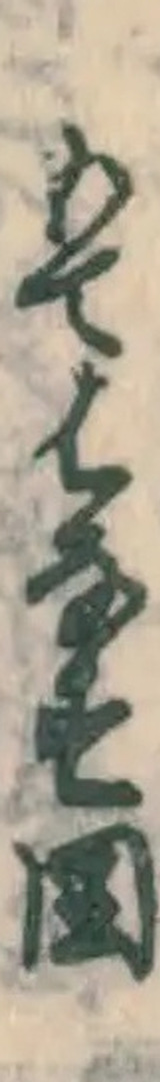もてはなす図
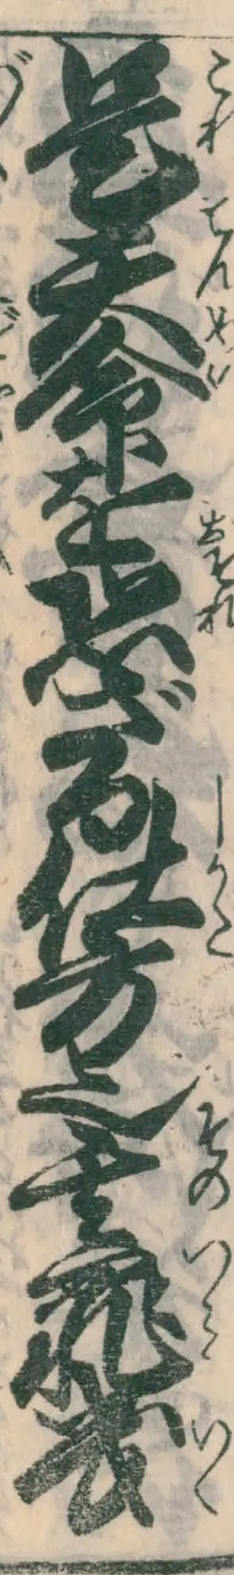是天命を恐ざる仕方也其罪幾
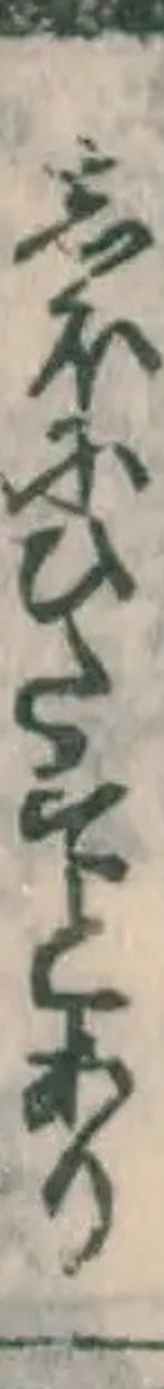しほにひたすことあり
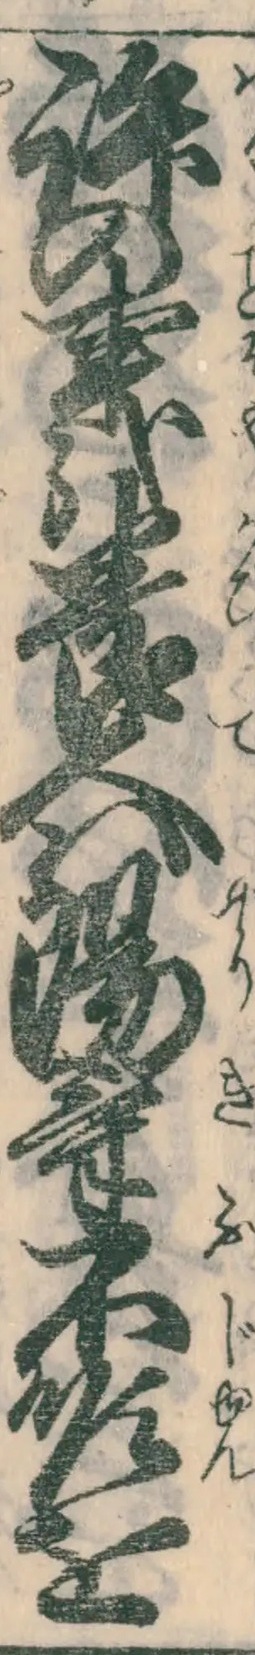許の事哉養人は陽気不順を
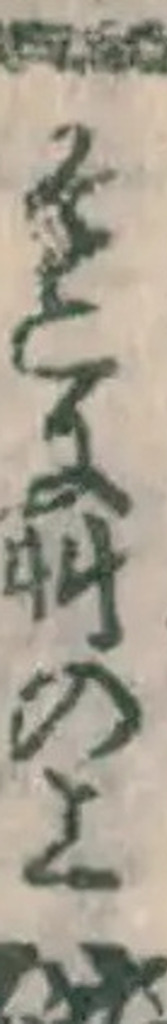そとに竹の上
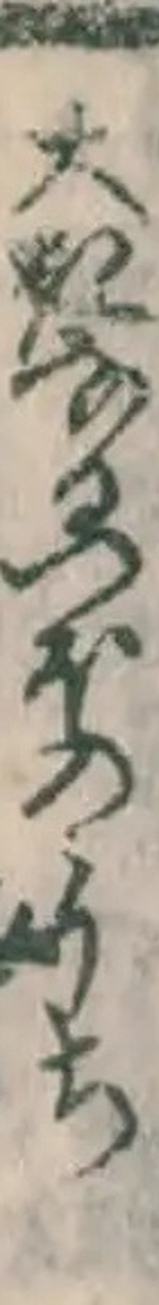大きなるつほのうち
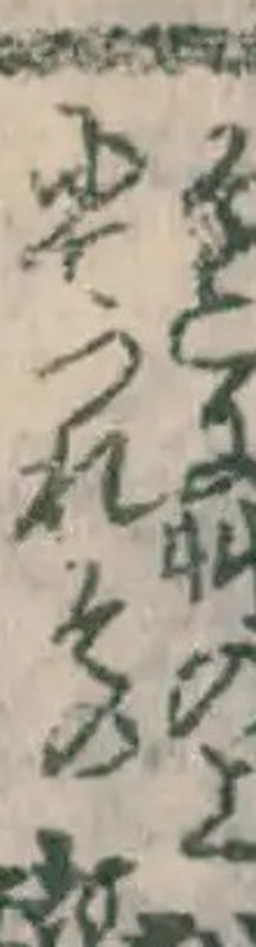にていれその
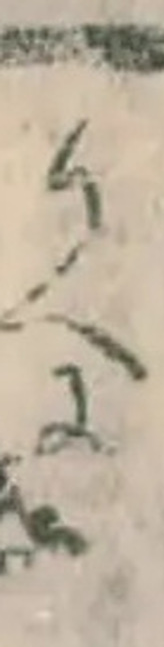うへに
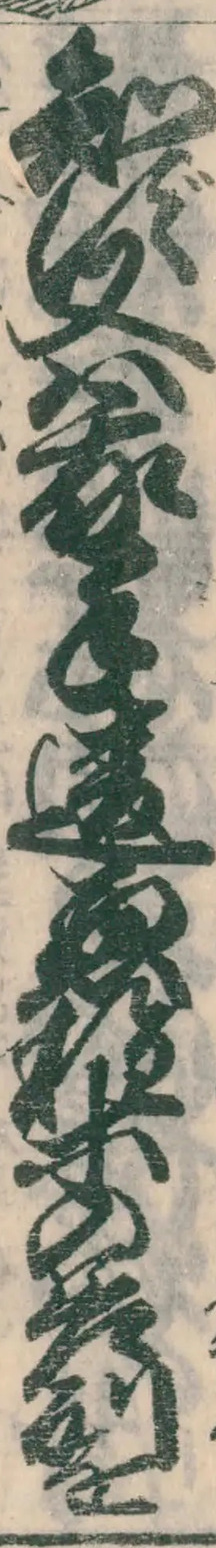知ず又は我手違悪種等の差別を
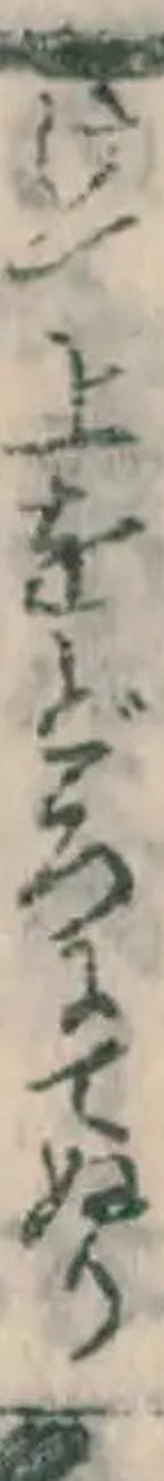けて上をどろにてぬり
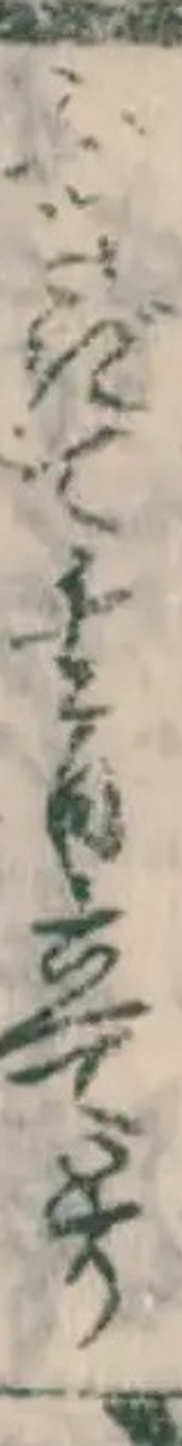ふさぎて其日立てとり
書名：養蚕往来
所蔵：国立国会図書館 National Diet Library, JAPAN
